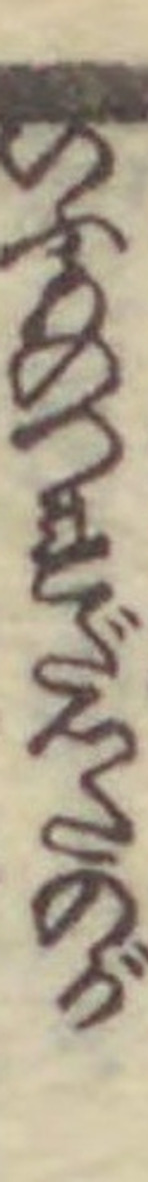いふものつれだつたのが
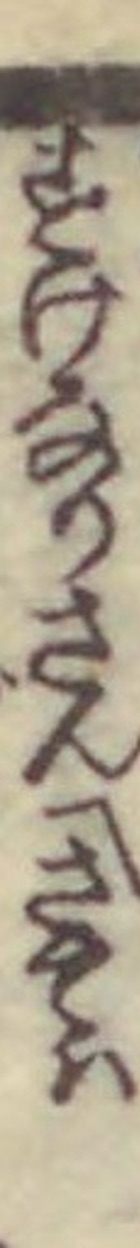すけなりさん〽さては
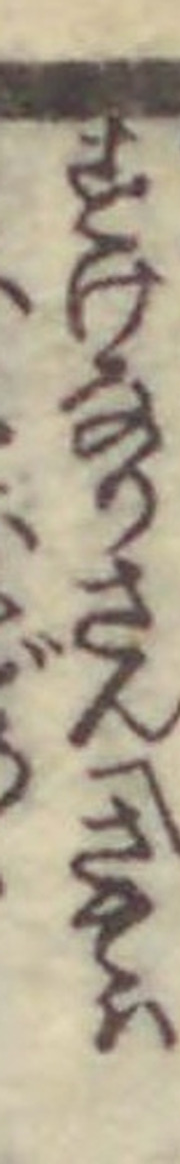すけなりさん〽さては
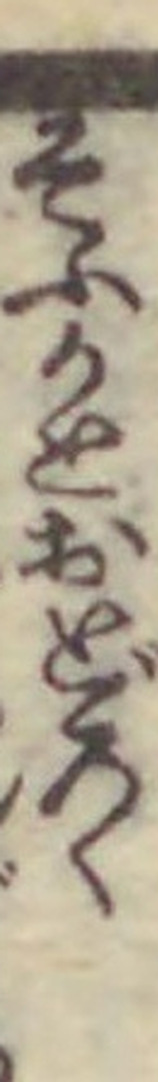そふかとおどろく
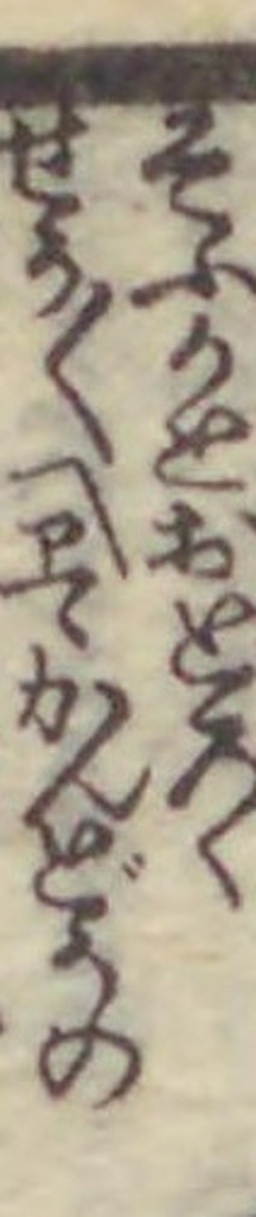せう〳〵ヱヽかんどうの
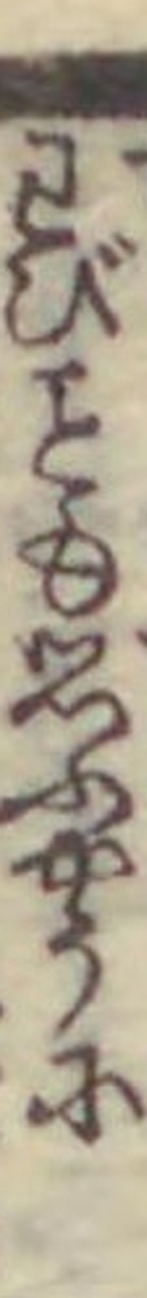わびことも思ふやうに
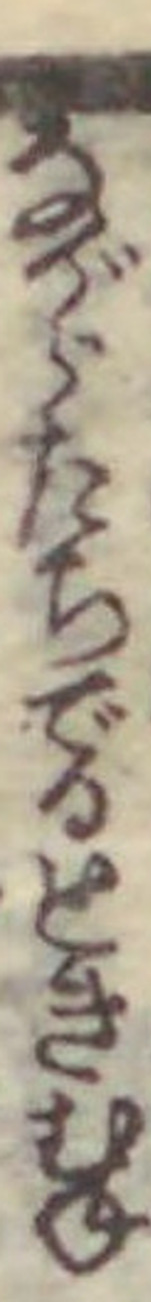ながらたちでるときむね
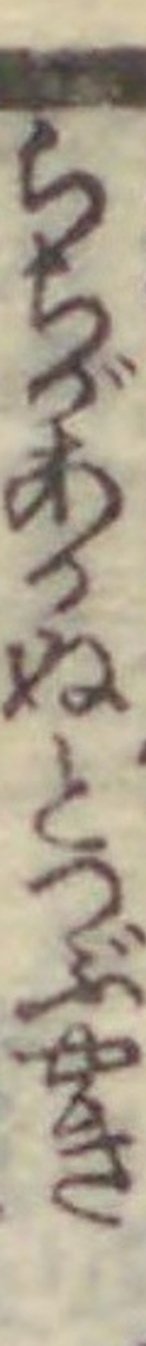らちがあかぬとつぶやき
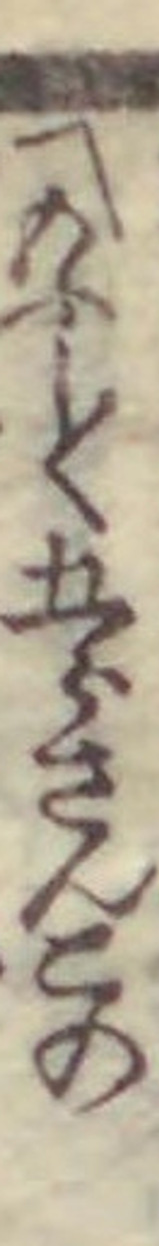〽もふし〳〵五郎さんこの
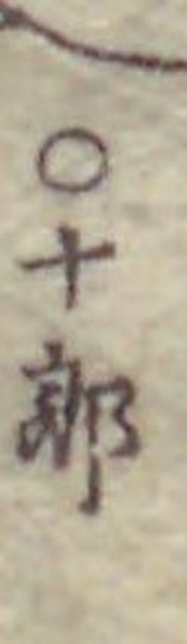○十郎
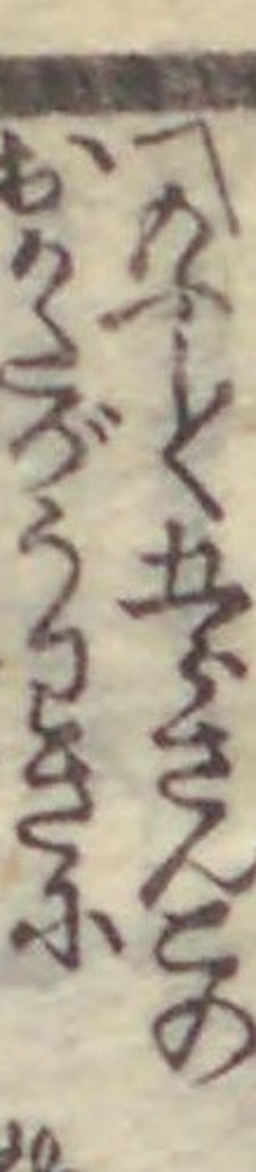おかたがうわさに
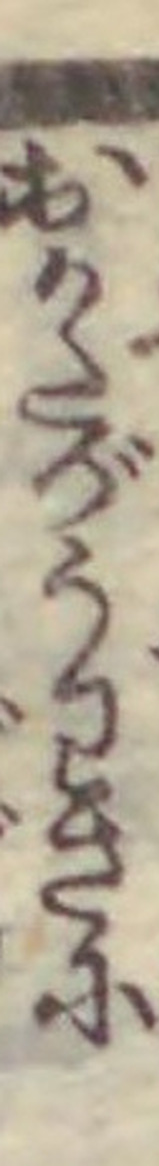おかたがうわさに
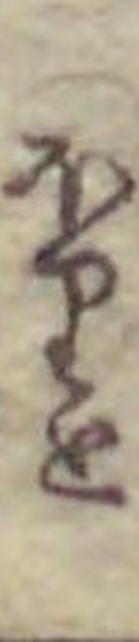ほりと
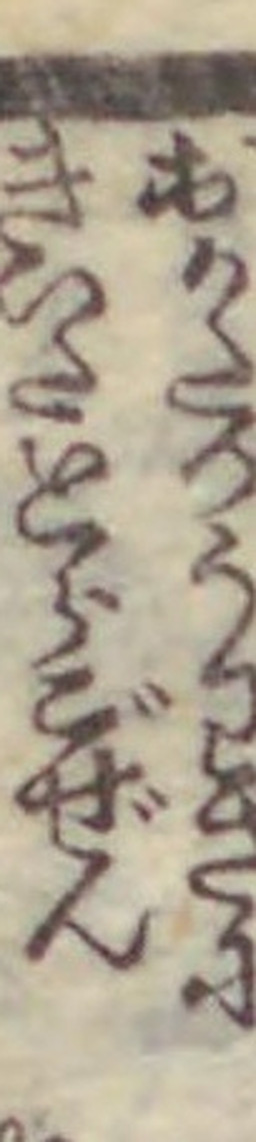きいたとらごぜん
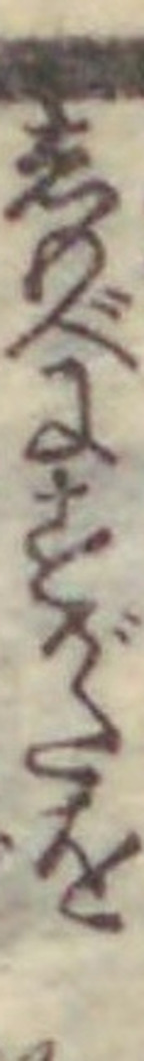しもべにすがたを
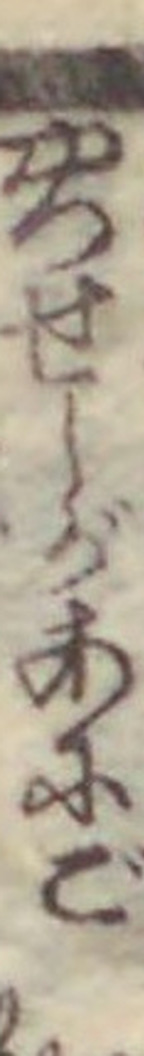やつせしがあにご
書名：大時代唐土化物 3巻. 曽我太夫染
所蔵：国立国会図書館 National Diet Library, JAPAN
